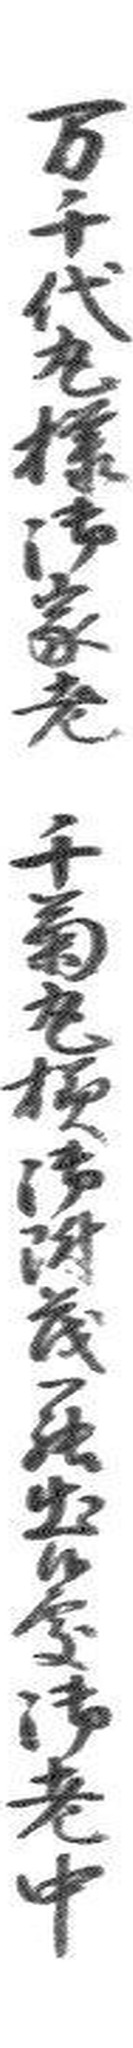万千代丸様御家老千菊丸様御付茂罷出候処御老中
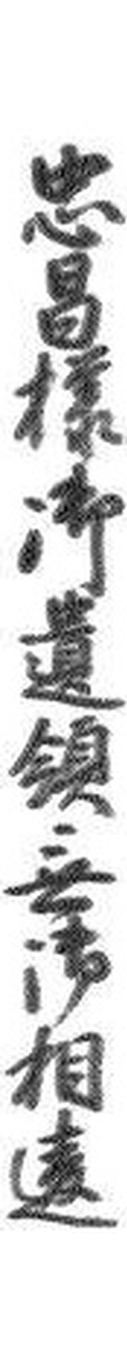忠昌様御遺領無御相違
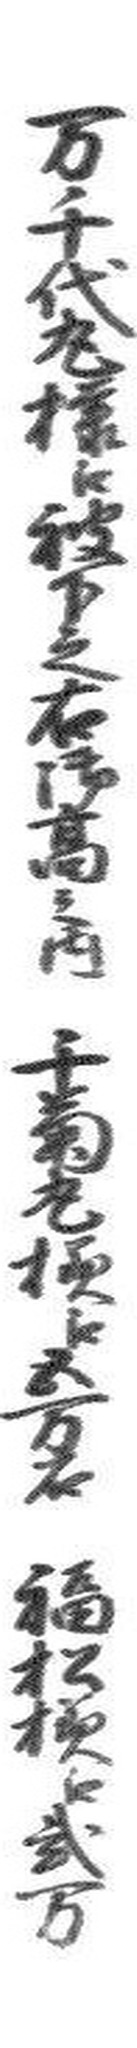万千代丸様江被下之右御高之内千菊丸様江五万石福松様江弐万
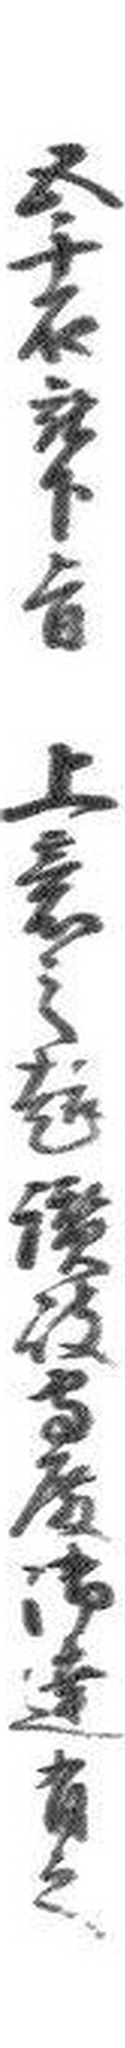五千石被下旨上意之趣讃岐守殿御達有之
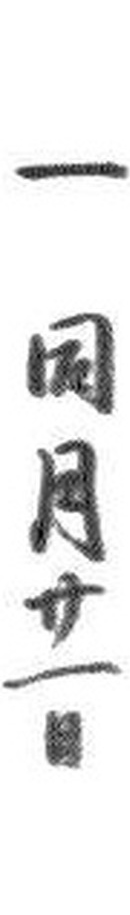一同月廿一日

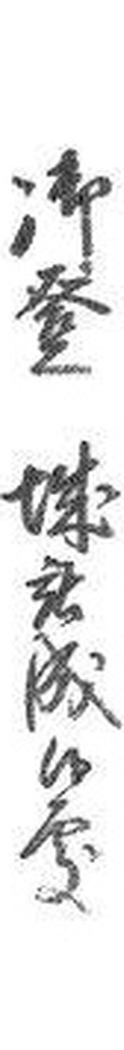御登城被成候処
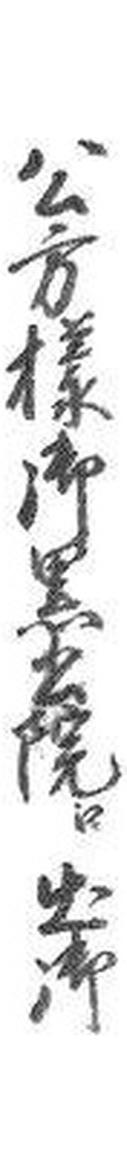公方様御黒書院江出御
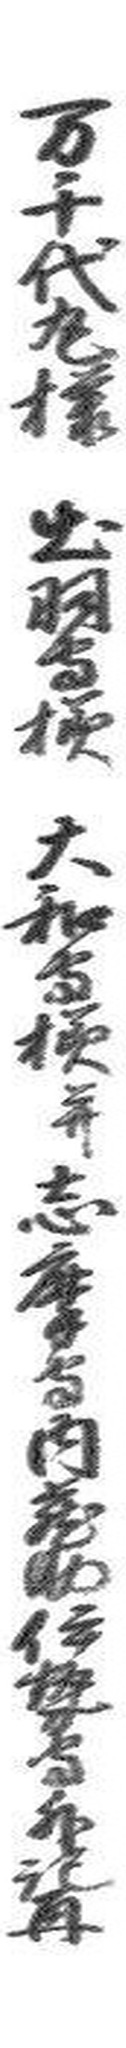万千代丸様出羽守様大和守様并志摩守内蔵助伊勢守外記再
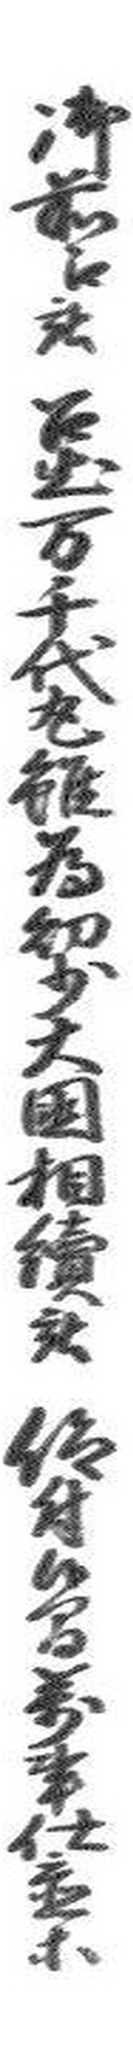御前江被召出万千代丸雖為幼少大国相続被仰付候間万事仕置等
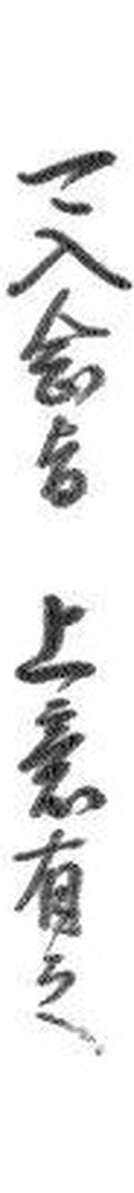可入念旨上意有之
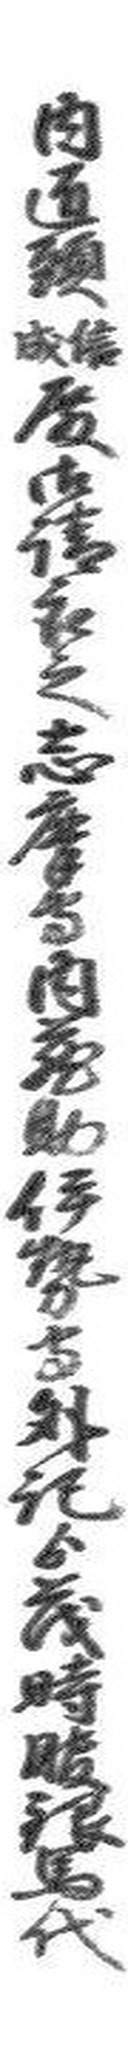内匠頭信成殿御請取之志摩守内蔵助伊勢守外記ゟ茂時服銀馬代
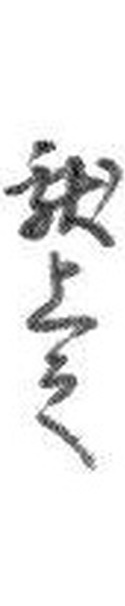献上之
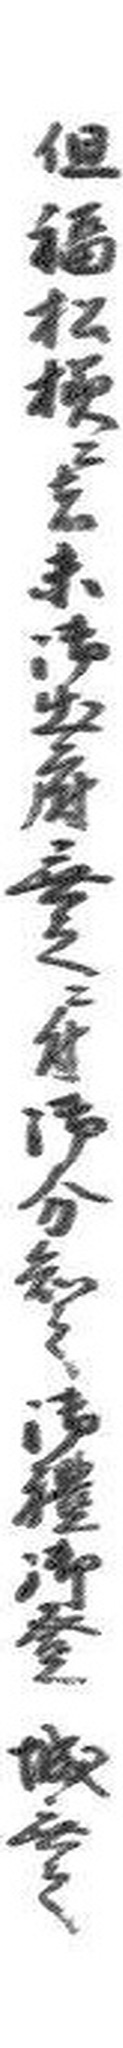但福松様ニ者未御出府無之ニ付御礼御登城無之
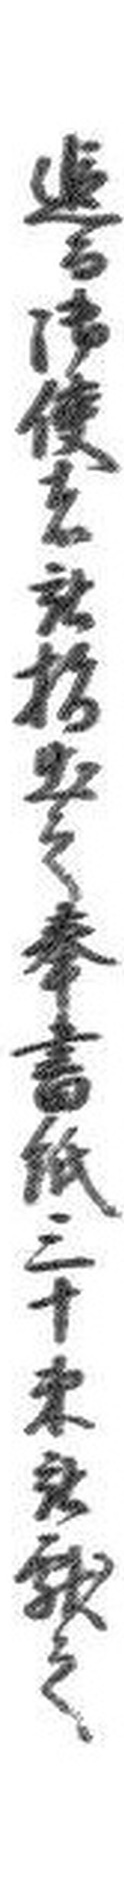追而御使者被指出之奉書紙三十束被献之
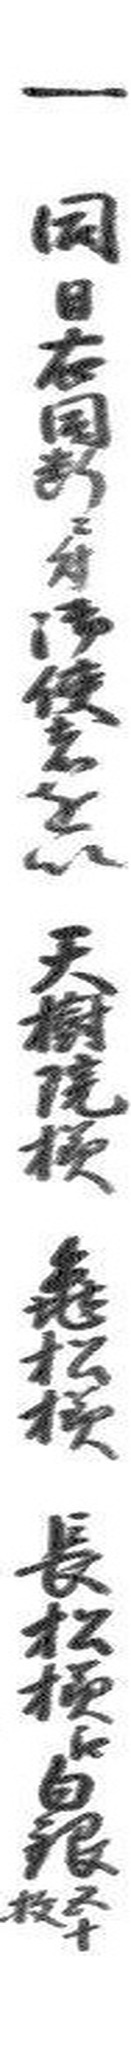一同日右同断ニ付御使者を以天樹院様亀松様長松様江白銀五十枚

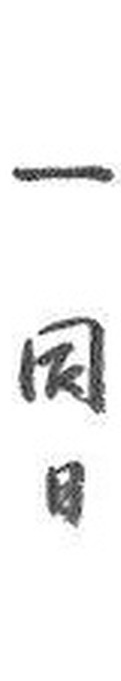一同日
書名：家譜 五 光通公 従寛永十三年到万治二年
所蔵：福井県文書館 Fukui Prefectural Archives
